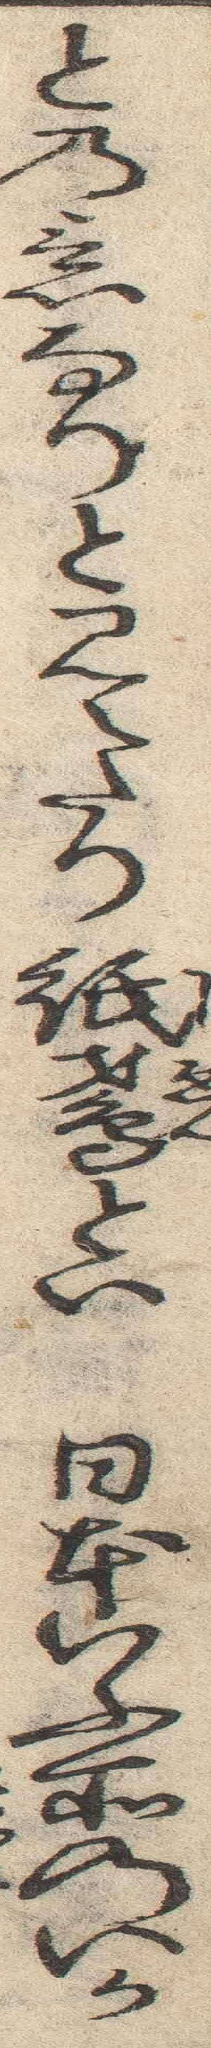との意なりと見えたり紙鳶とは日本いふ所のいか
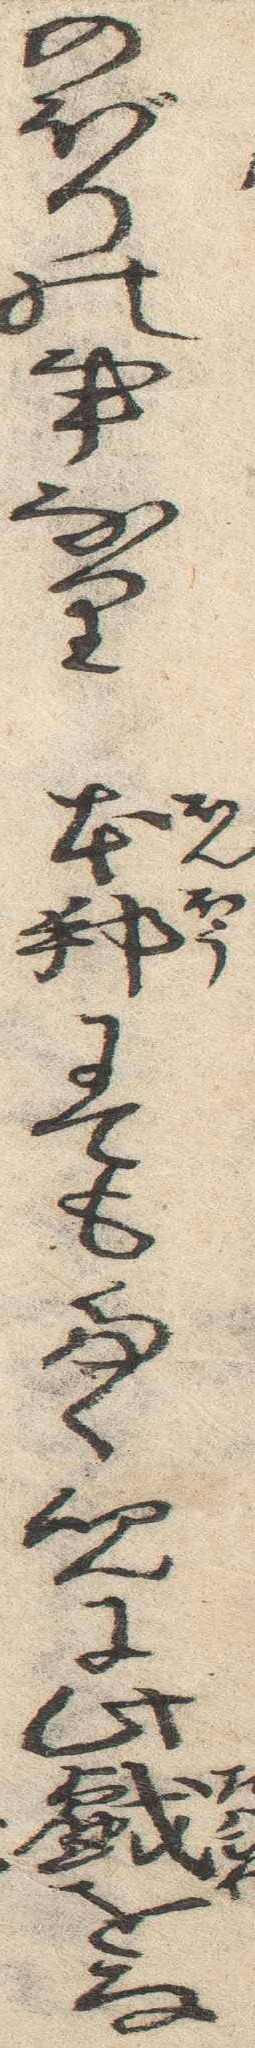のぼりの事なり本邦にても多く児に此戯をな
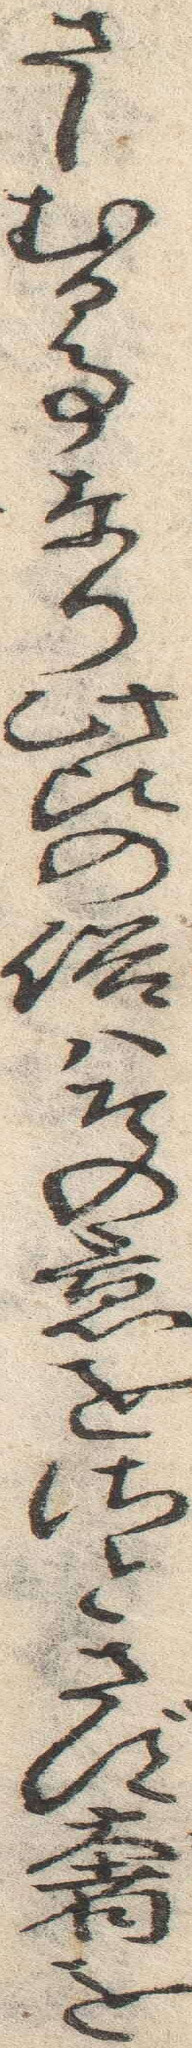さしむる事なり此比の俗はその意をさとさず奢を
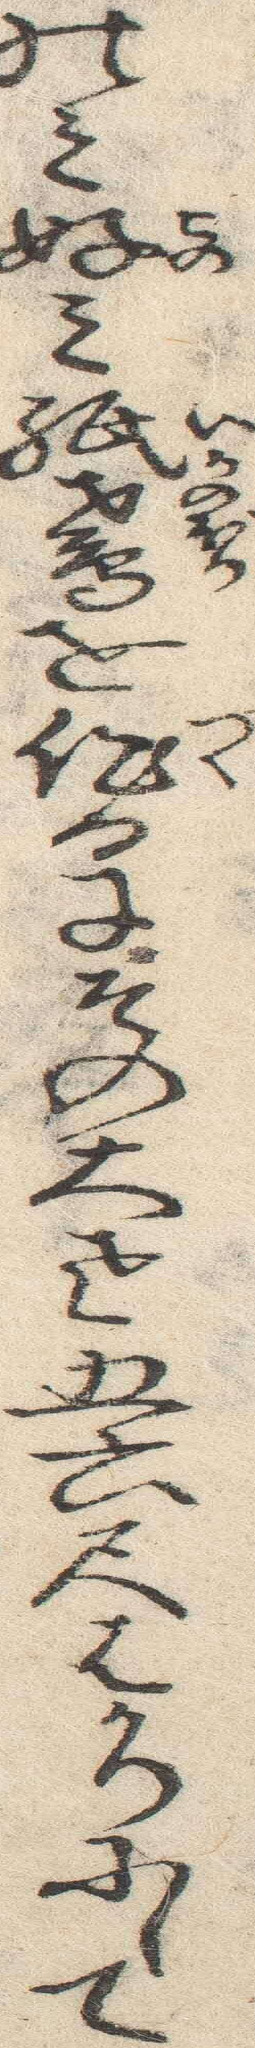のみ好み紙鳶を作るにその大さ五六尺はかりにして
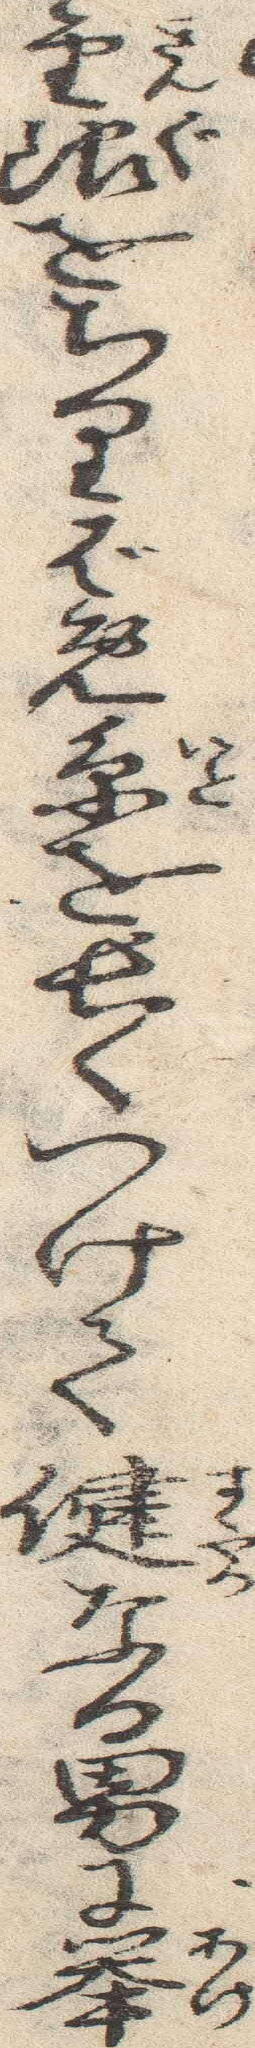金銀をちりばめ糸を長くつけて健なる男に挙
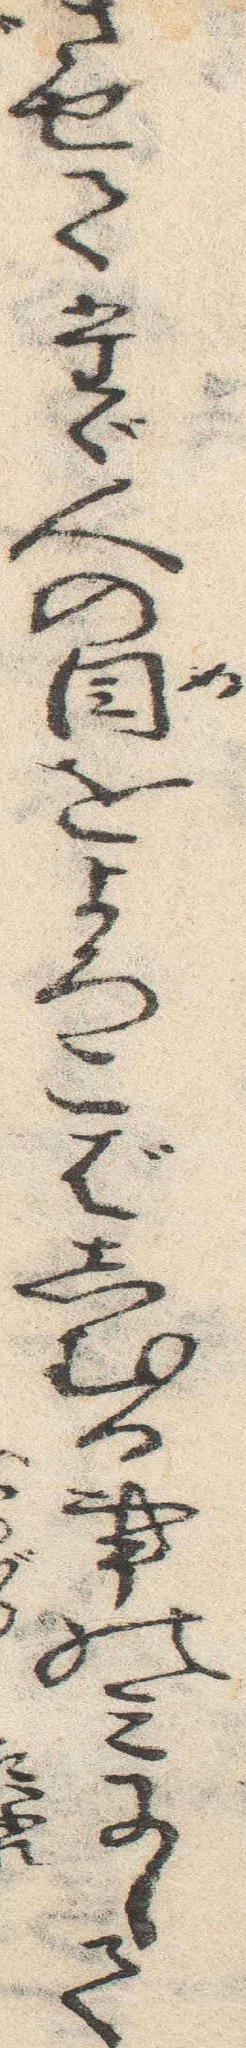させてたゞ人の目をよろこばしむる事のみにして
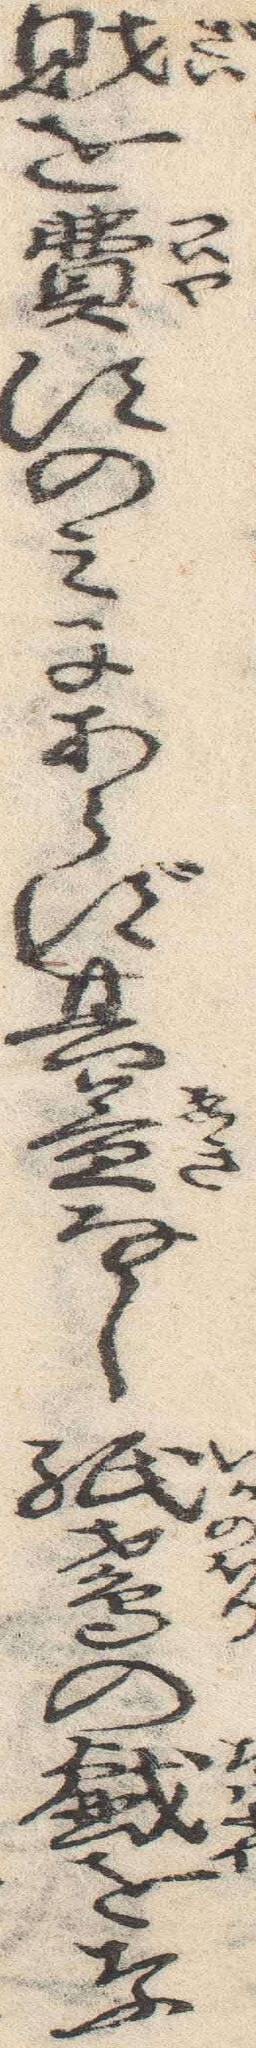財を費すのみにあらず其益なし紙鳶の戯をな
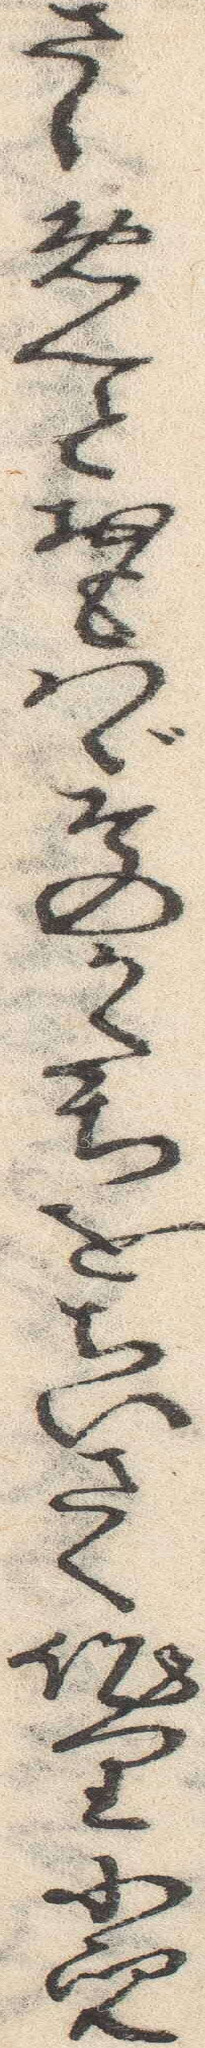さしめんとおもはゞそのかたちをちいさく作り小児
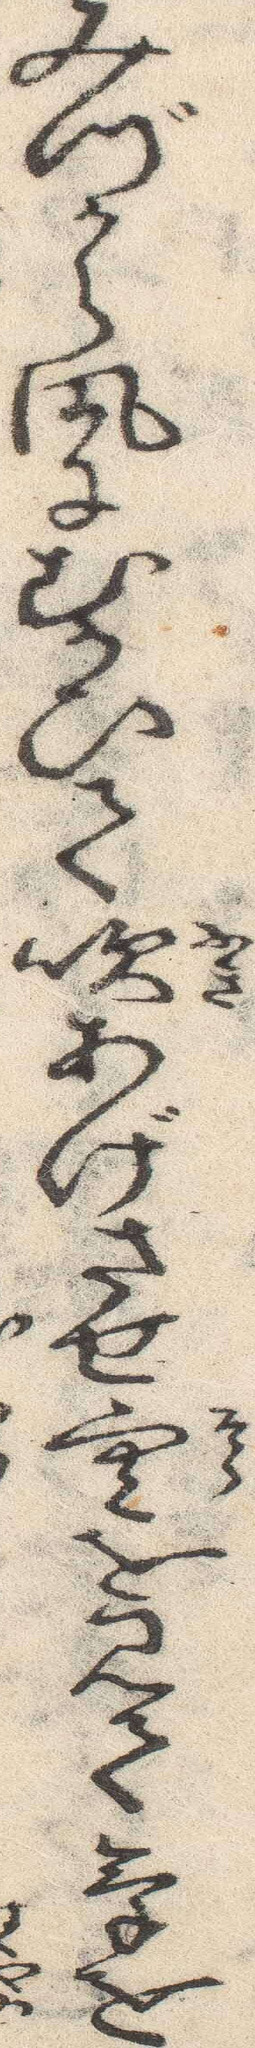みづから風にむかひて吹あげさせ空を見て気を
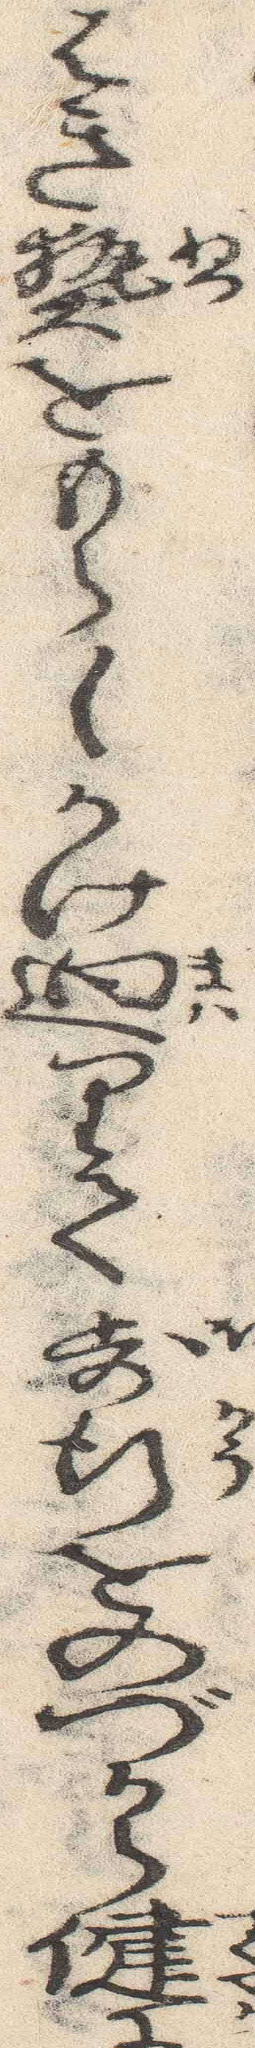はき熱をもらしかけ廻りて歩行をのづから健に
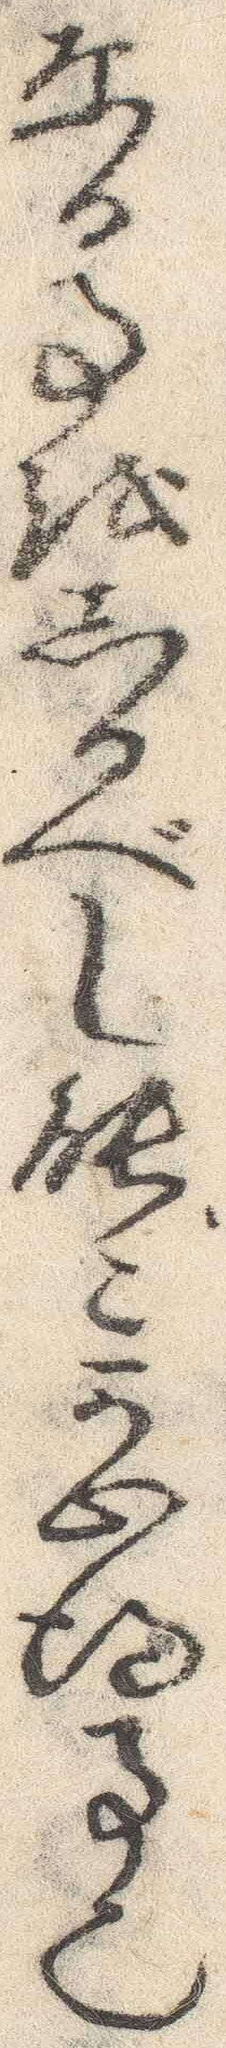なる事をしるべし能々可心得事也
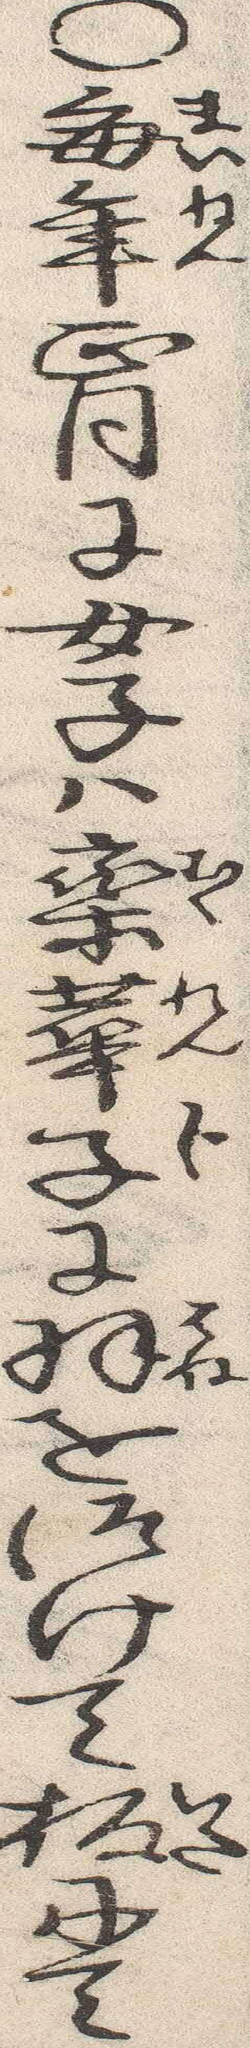○毎年正月に女子は欒華子に羽をつけて板にて
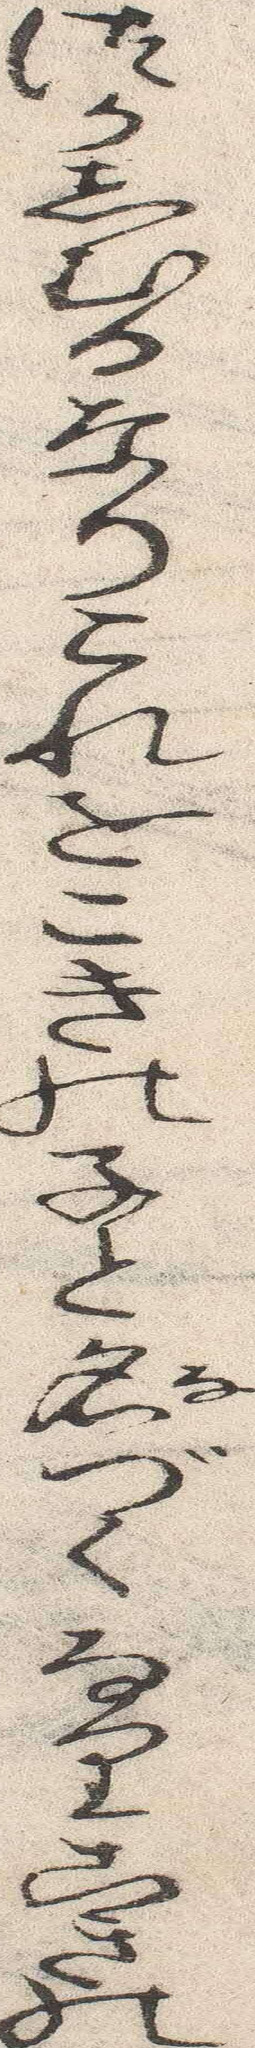つかしむるなりこれをこきの子と名づくなりこきの
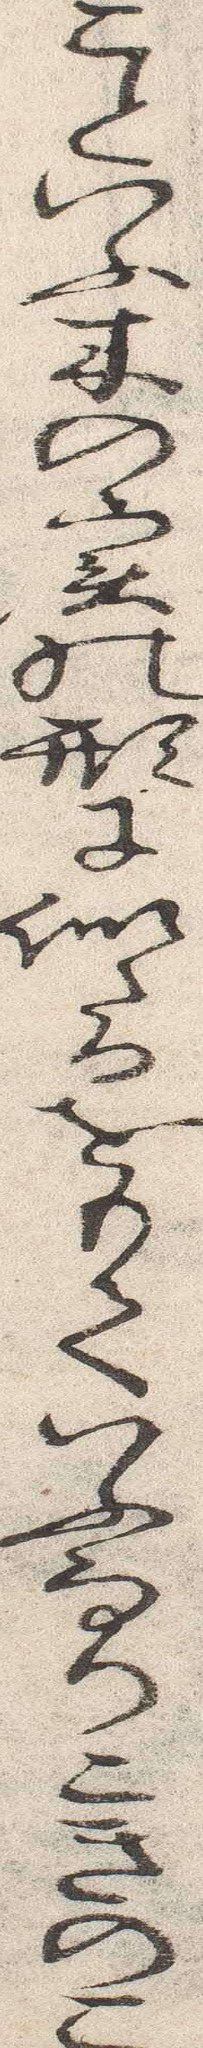こといふ木の実の形に似たるをもていふなりこきのこ
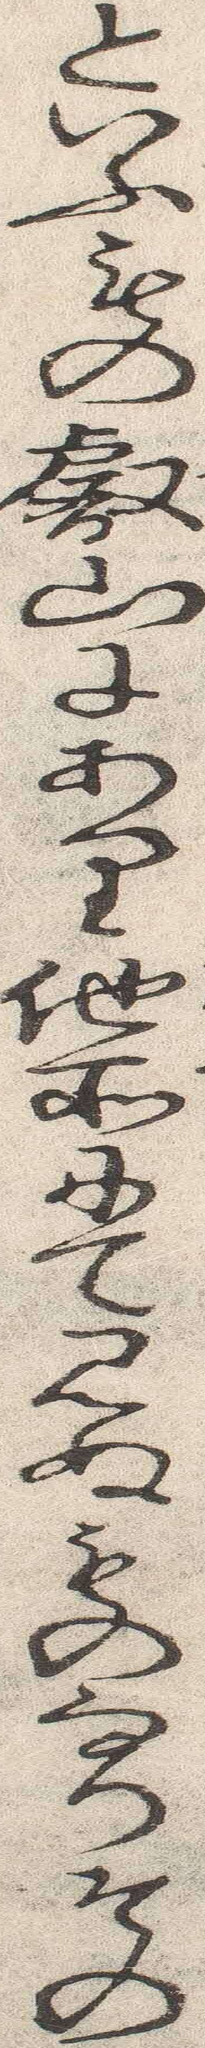といふもの叡山にあり他所にて見ぬものなりその
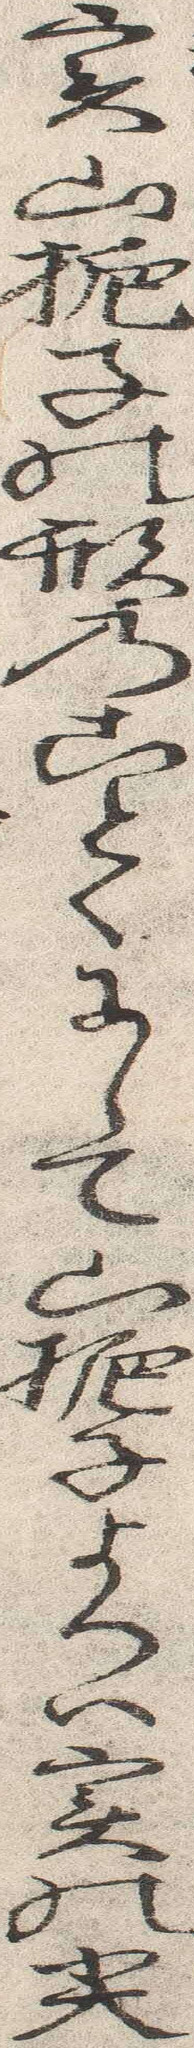実山梔子の形のことくにして山梔子よりは実の尖
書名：小児必用養育草
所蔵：東京学芸大学附属図書館 国文学研究資料館
